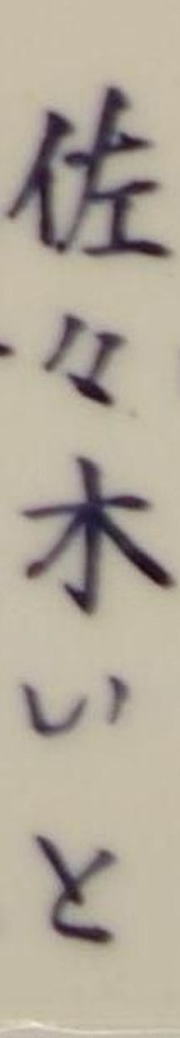佐々木いと
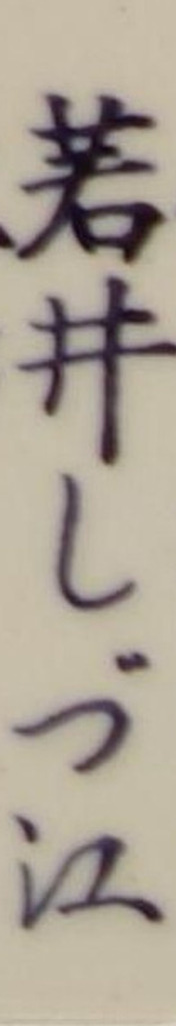若井しづ江
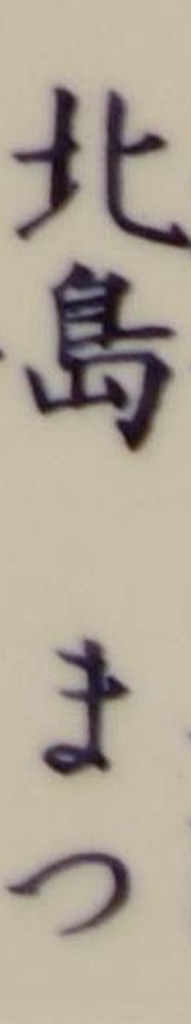北島まつ
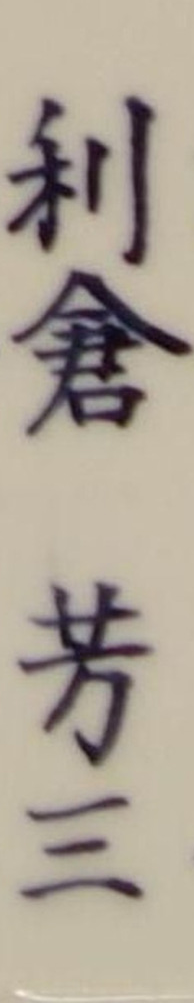利倉芳三
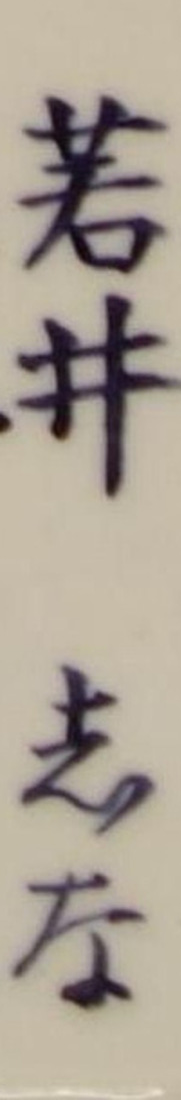若井しな
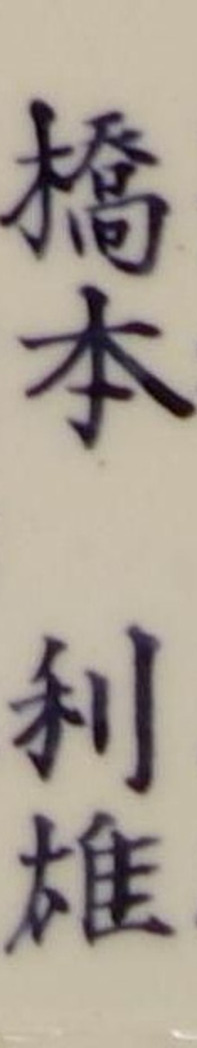橋本利雄
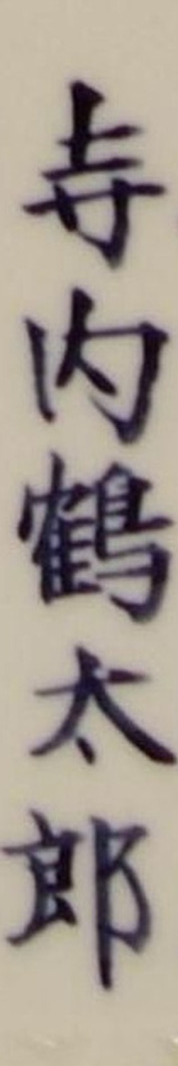寺内鶴太郎
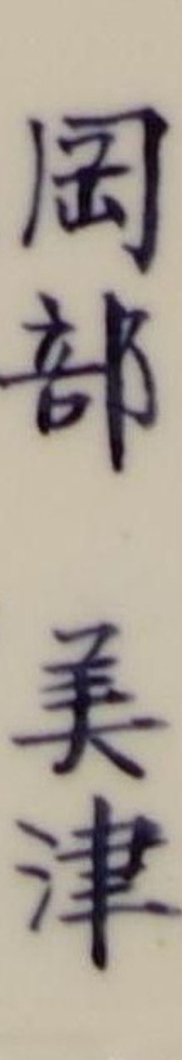岡部美津
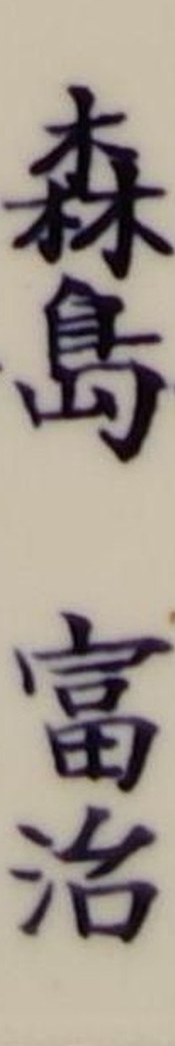森島富治
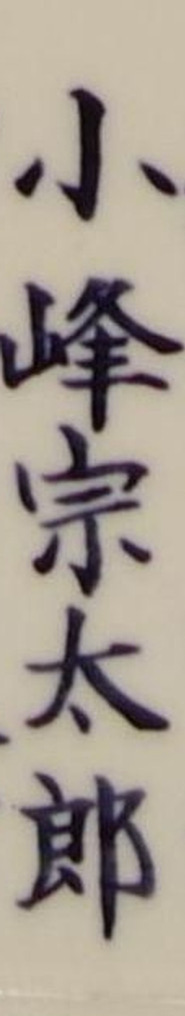小峰宗太郎
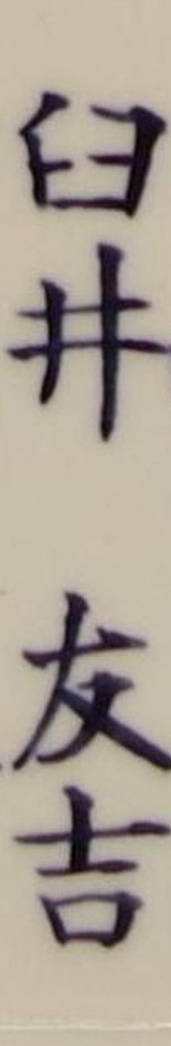臼井友吉
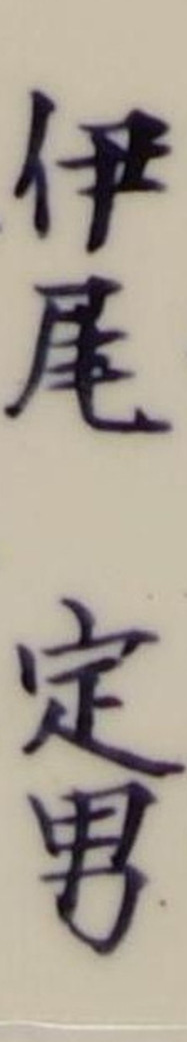伊尾定男
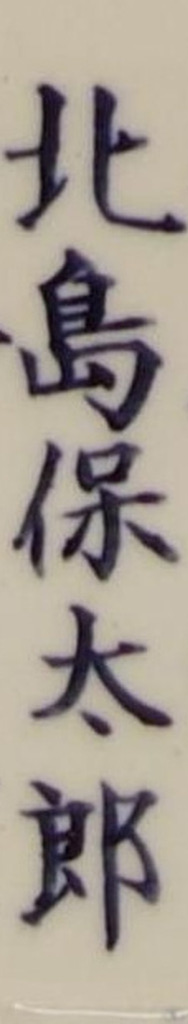北島保太郎
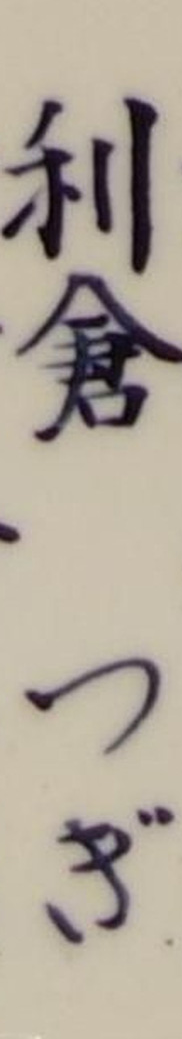利倉つぎ
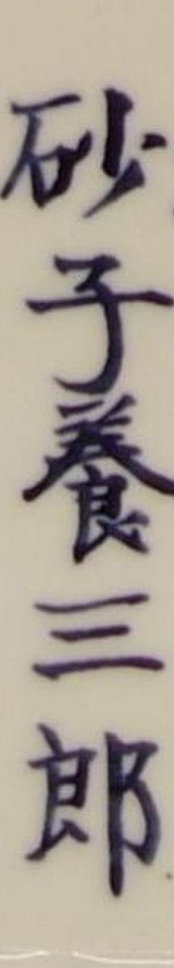砂子養三郎
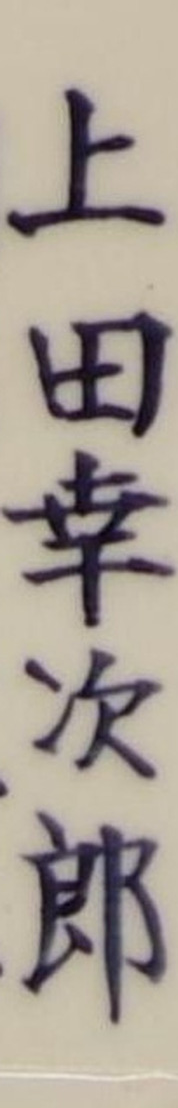上田幸次郎
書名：M~S
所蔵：高野山金剛峯寺
